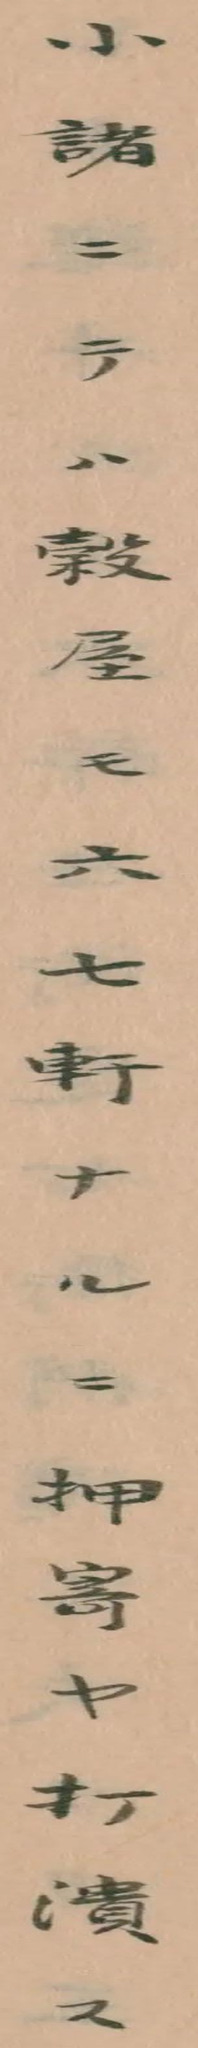小諸ニテハ穀屋モ六七軒ナル二押寄ヤ打潰ス
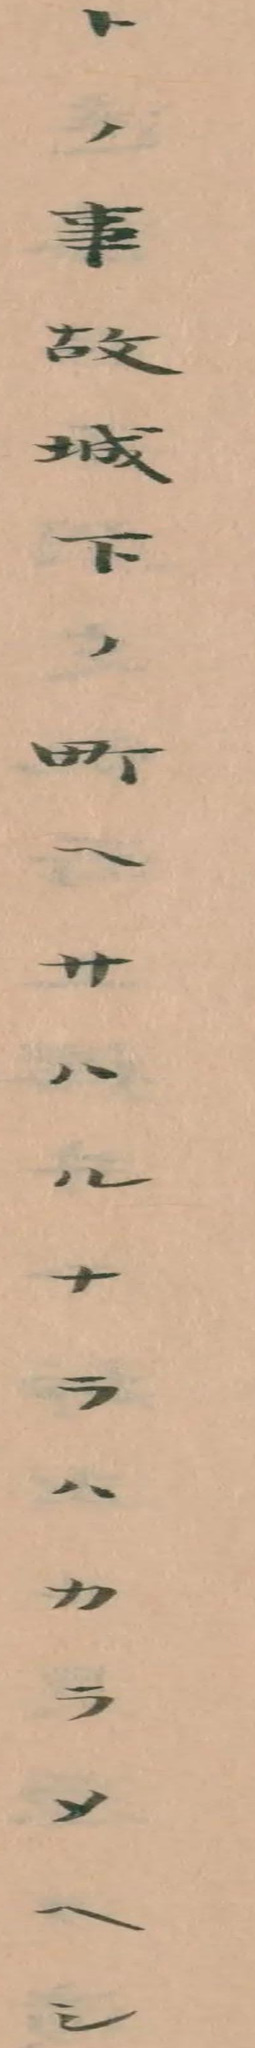トノ事故城下ノ町ヘサハㇽナラハカラメへシ
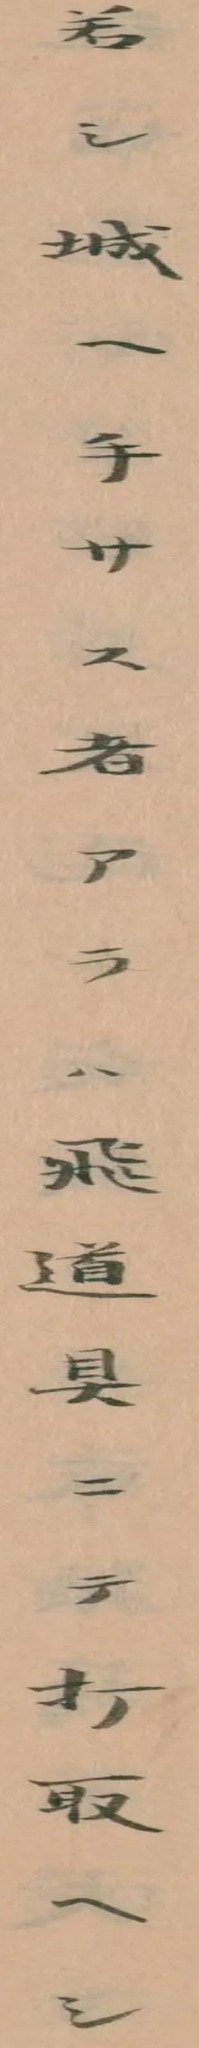若シ城ヘ手サス者アラハ飛道具ニテ打取へシ
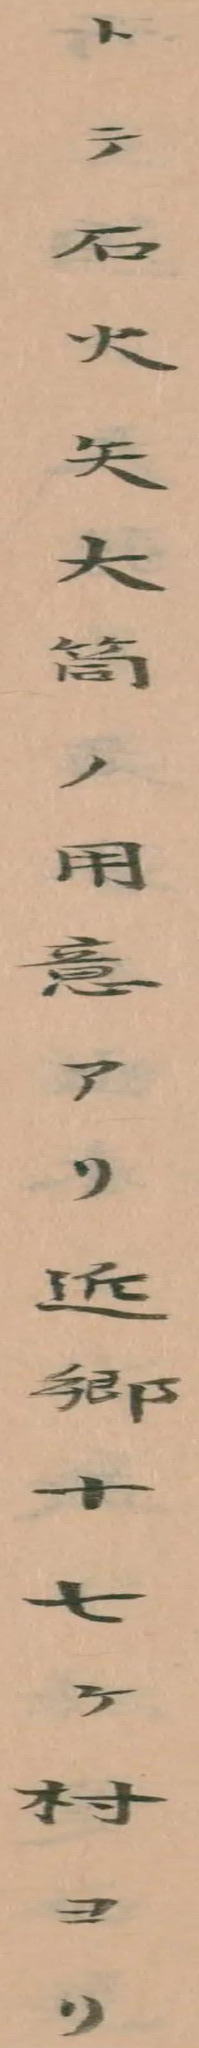トテ石火矢大筒ノ用意アリ近郷十七ヶ村ヨリ
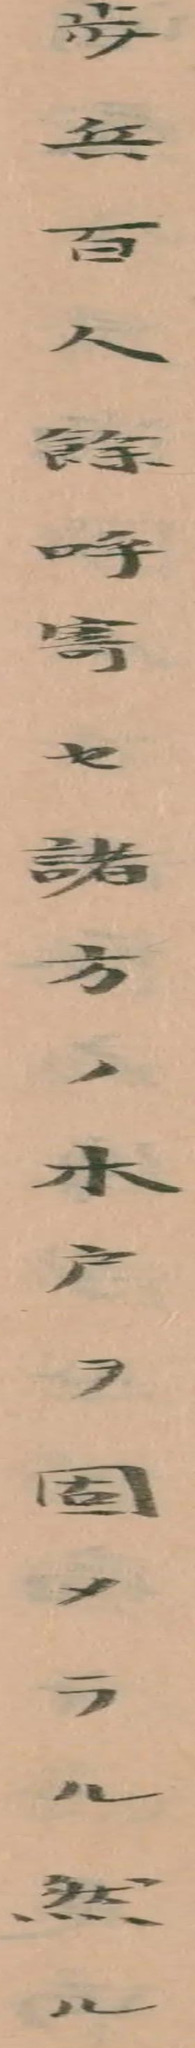歩兵百人余呼寄セ諸方ノ木戸ヲ固メラㇽ然ル
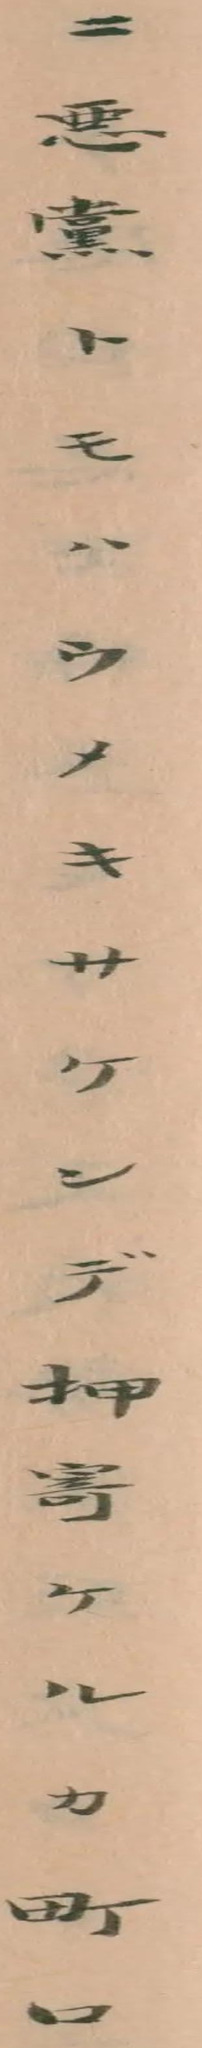二悪党トモハウメキサケンデ押寄ケルカ町口
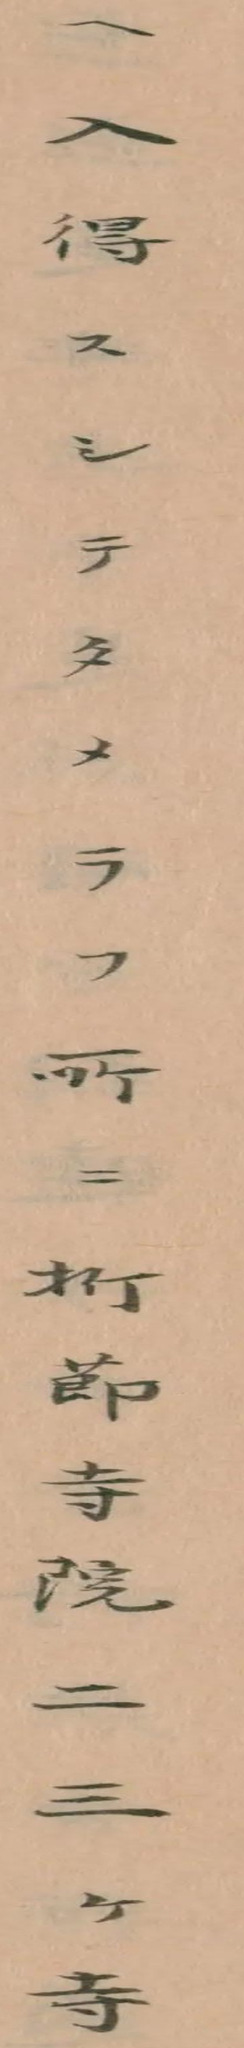へ入得スシテタメラフ所二折節寺院二三ヶ寺
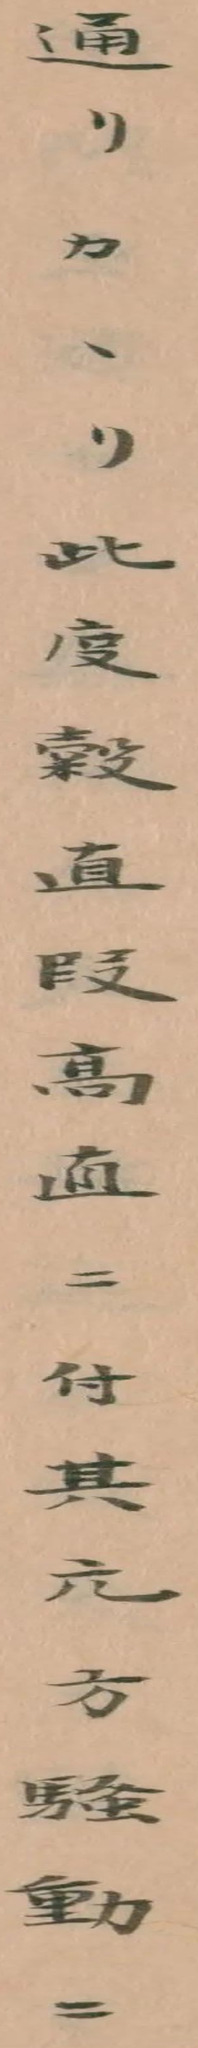通リカゝリ此度穀直段高直二付其元方騒動二」
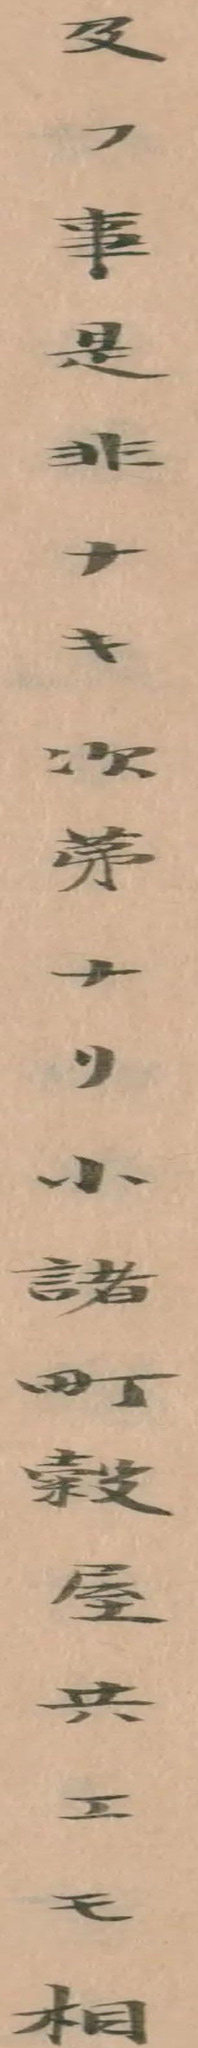及フ事是非ナキ次第ナリ小諸町穀屋共エモ相
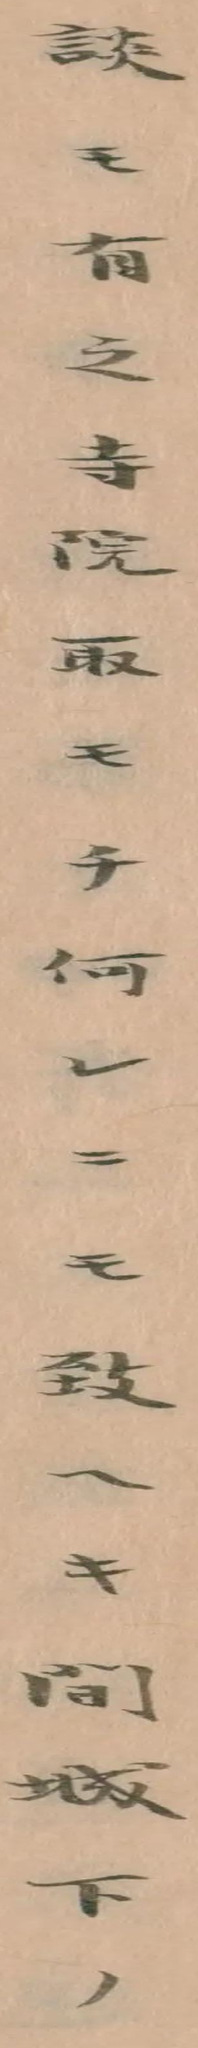談モ有之寺院取モチ何レ二モ致ヘキ間城下ノ
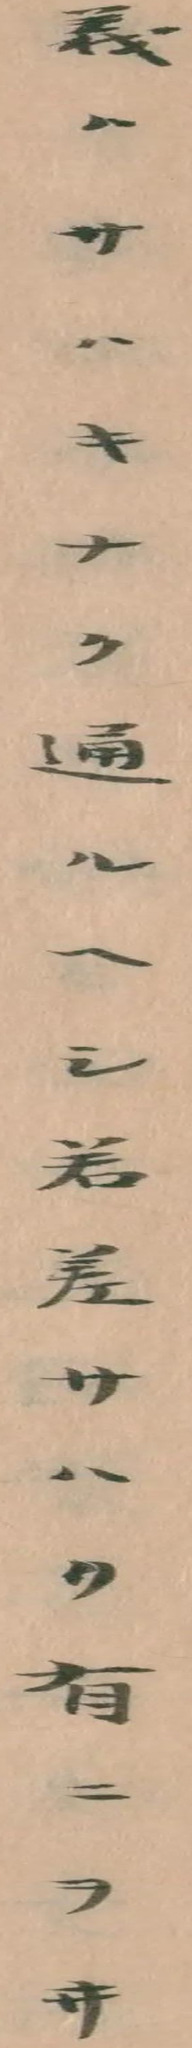義ハサハキナク通ルへシ若差サハリ有ニヲ井
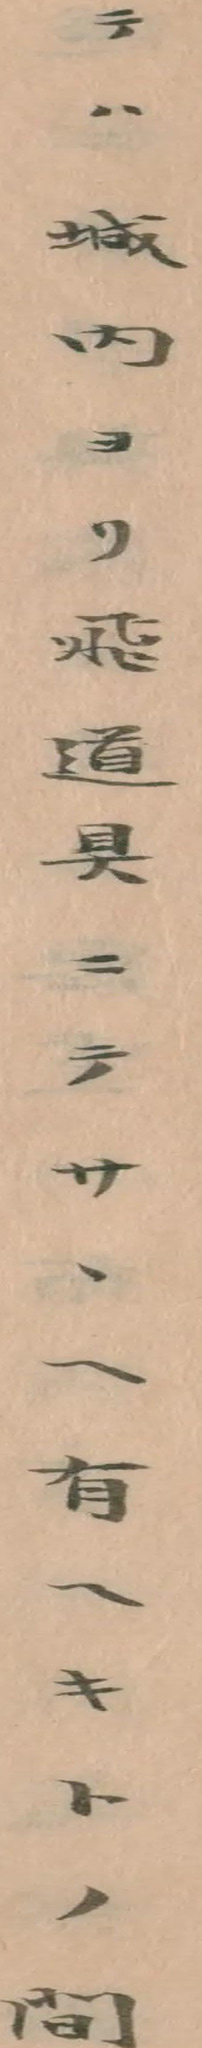テハ城内ヨリ飛道具ニテサゝヘ有ヘキトノ間
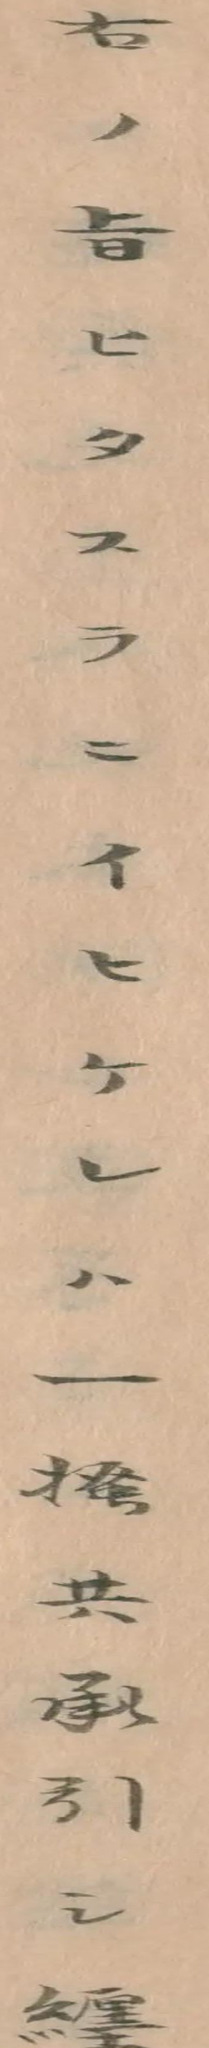右ノ旨ヒタスラ二イヒケレハ一揆共承引シ纏
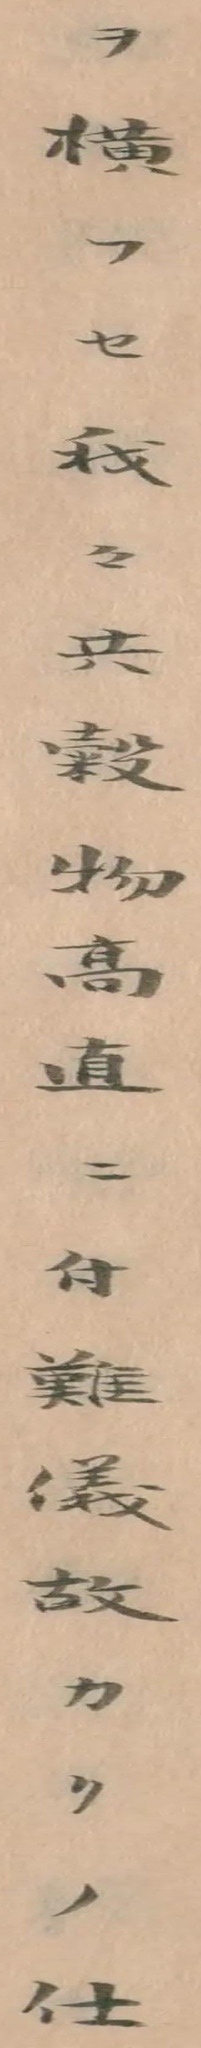ヲ横フセ我々共穀物高直二付難儀故カクノ仕
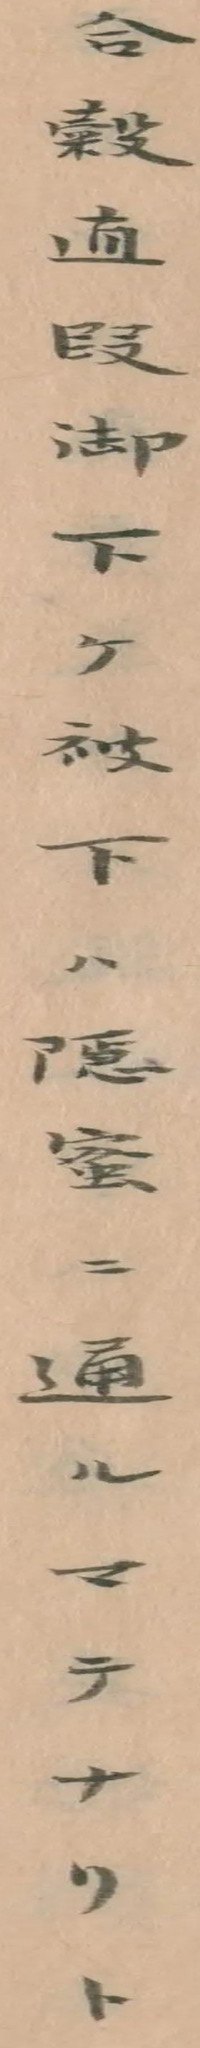合穀直段御下ヶ被下ハ隠密二通ルマテナリト

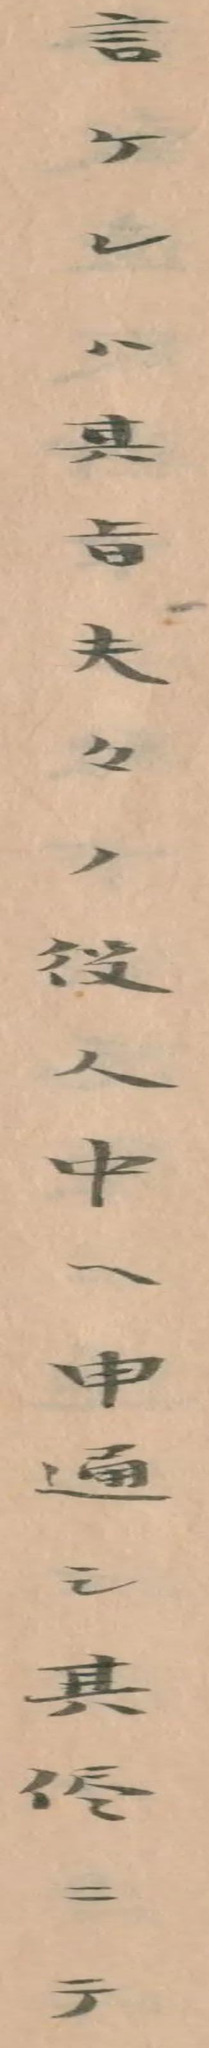言ケレハ其旨夫々ノ役人中ヘ申通シ其儘二テ
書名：地災撮要. 巻3(地震之部)-巻4(噴火之部)
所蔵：国立国会図書館 National Diet Library, JAPAN
